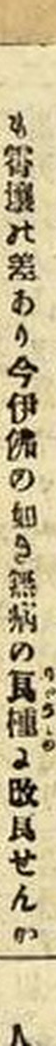も霄壌の差あり今伊仏の如き無病の良種に改良せんか
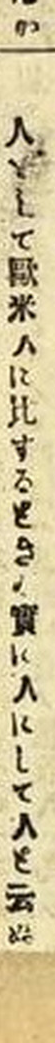人をして欧米人に比するときは実に人にして人と云ふ
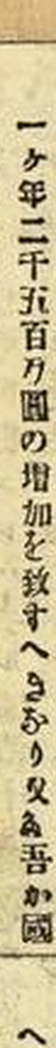一ケ年二千五百万円の増加を致すへきなり又た吾か国
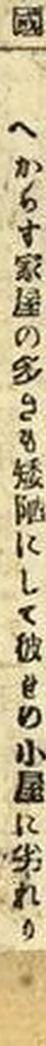へからす家屋の多きも矮陋にして彼れの小屋に劣れり
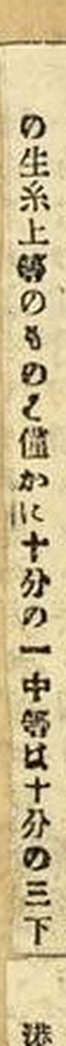の生糸上等のものは僅かに十分の一中等は十分の三下
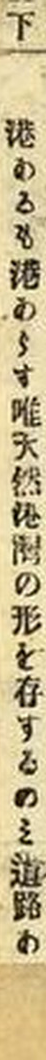港あるも港あらす唯天然港湾の形を存するのみ道路あ

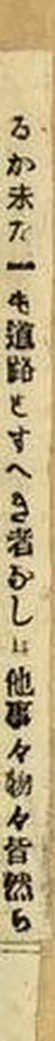るか未た一も道路とすへき者なしに他事々物々皆然ら
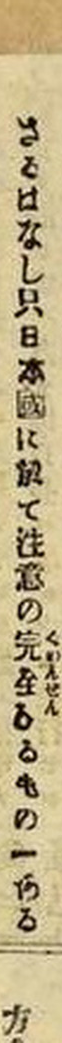さるはなし只日本国に於て注意の完全なるもの一ある
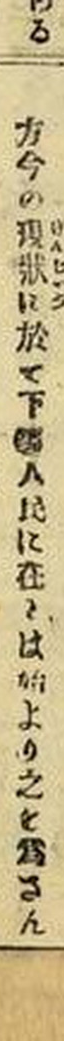方今の現状に於て下等人民に在ては始より之を為さん
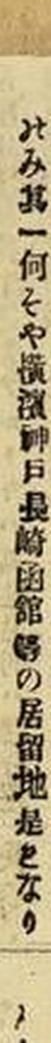のみ其一何そや横浜神戸長崎函館等の居留地是れなり
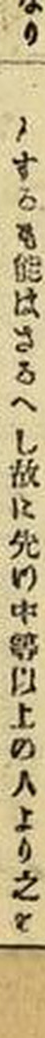とするも能はさるへし故に先つ中等以上の人より之を
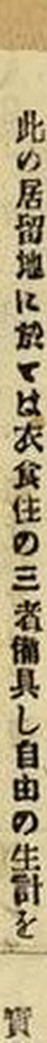此の居留地に於ては衣食住の三者備具し自由の生計を
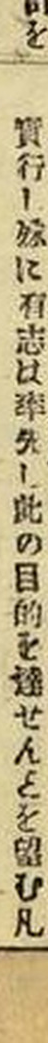実行し殊に有志は率先し此の目的を達せんことを望む凡
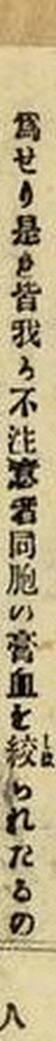為せり是れ皆我か不注意者同胞の膏血を絞られたるの
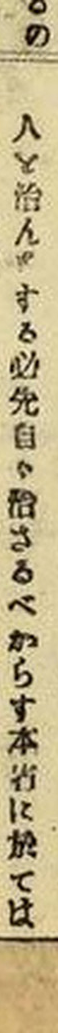人を治んとする必先自ら治さるべからす本省に於ては
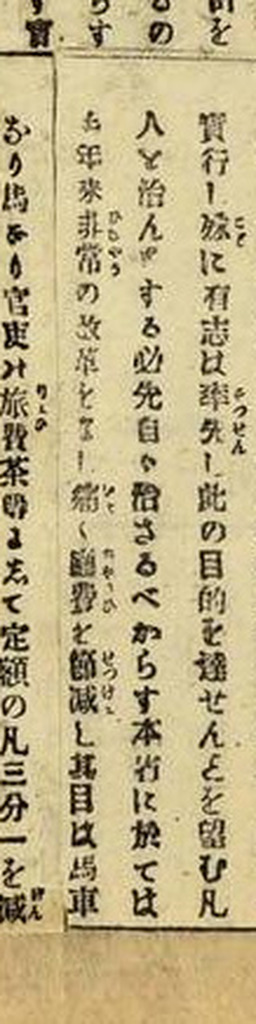人を治んとする必先自ら治さるべからす本省に於ては
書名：温古集 五巻
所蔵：福井県文書館 Fukui Prefectural Archives
